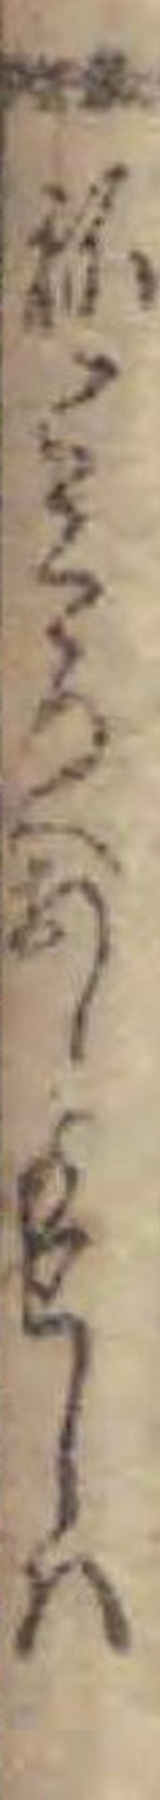ねところへおしよせしは
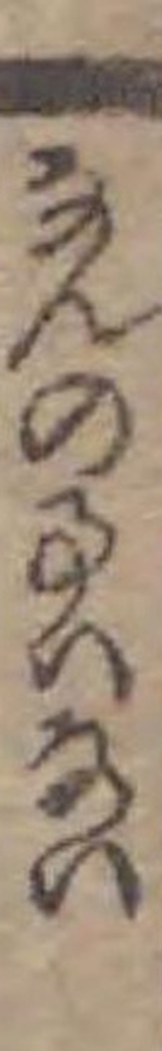なんの事はない
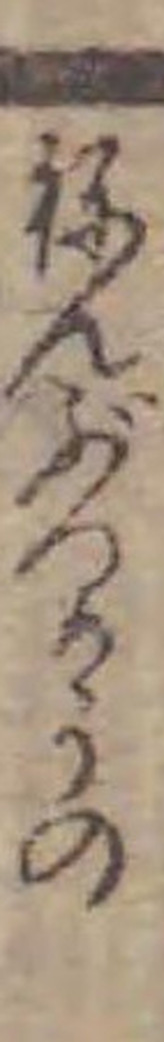ねんぶつかうの
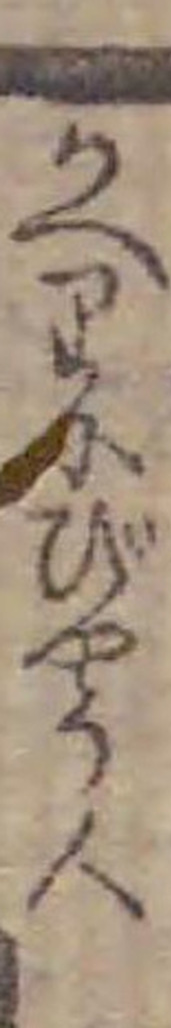かへりにびやう人
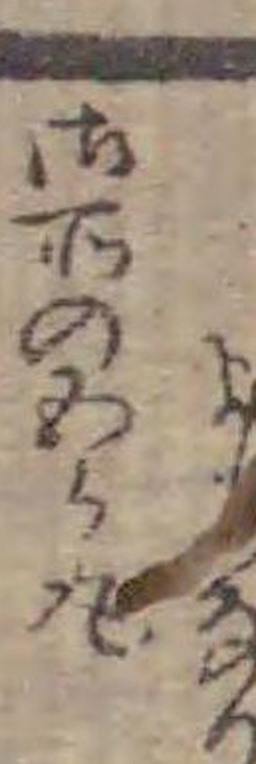御所の五郎丸
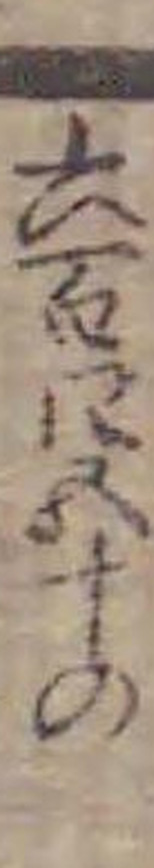六百四五十の
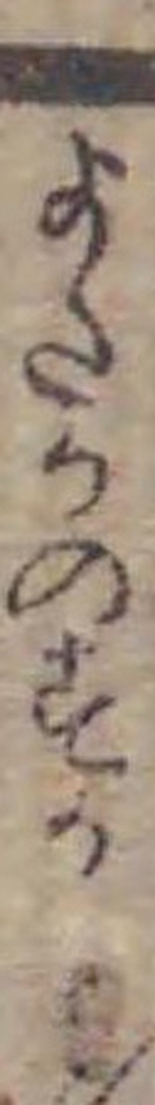よたかのすか
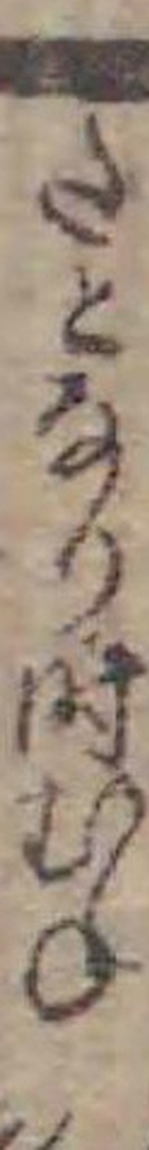たとなり時むね
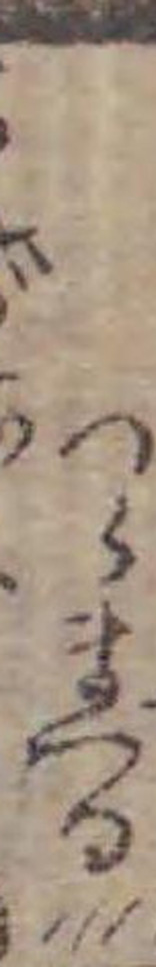つらまへる
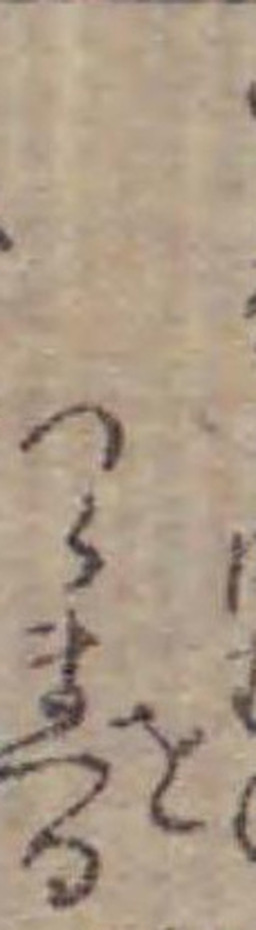つらまへる
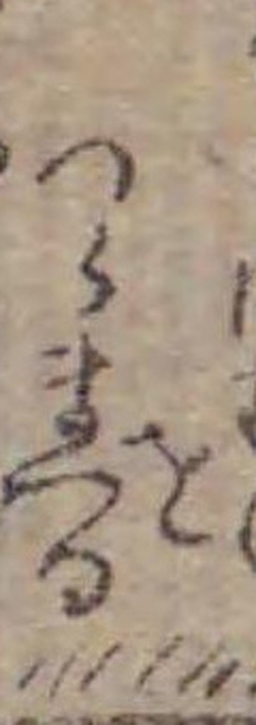つらまへる
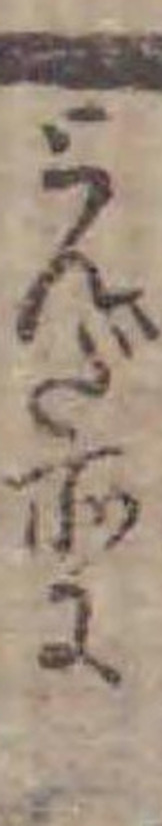とんだ所に
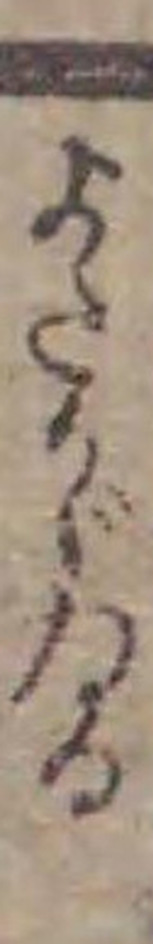よたかゞゐる
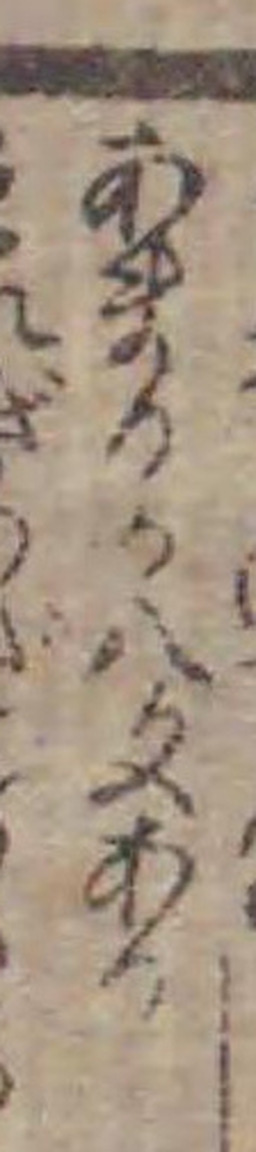あまりか八文あり
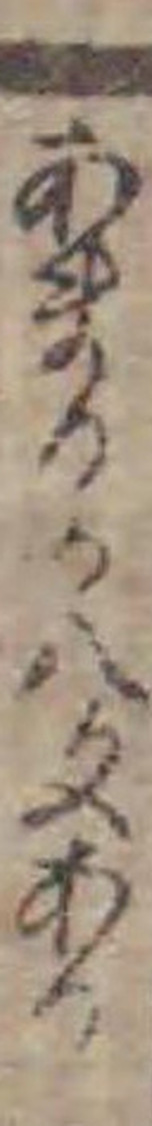あまりか八文あり
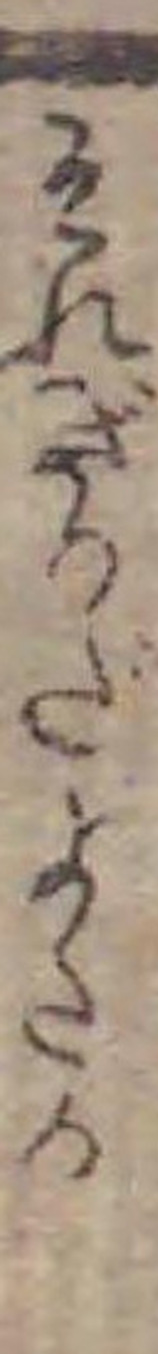それぎりだよたか
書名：年寄之冷水曽我 : 3巻
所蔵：国立国会図書館 National Diet Library, JAPAN
